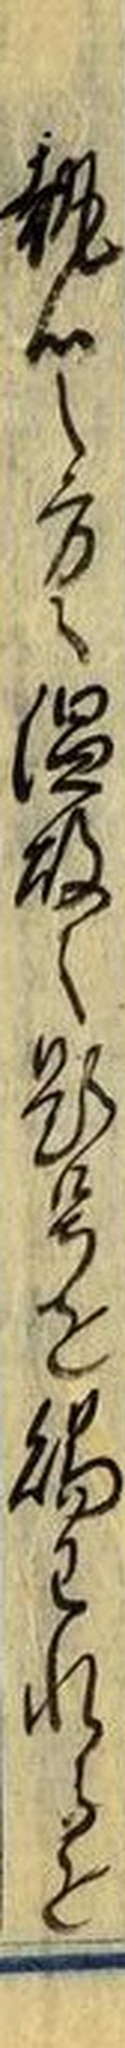執心之方々温故之題号を賜われるを
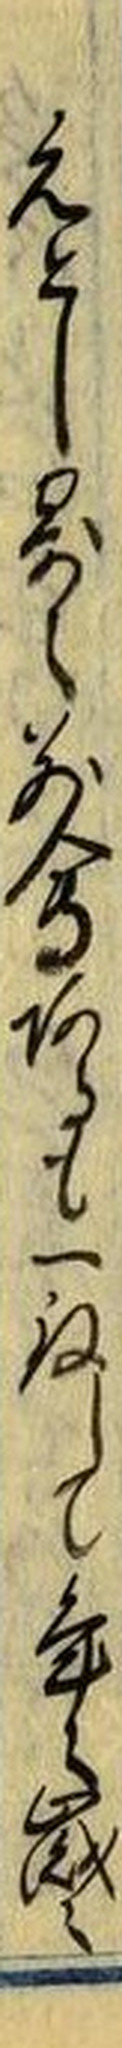元として寄々別会あるも一致して年々歳々
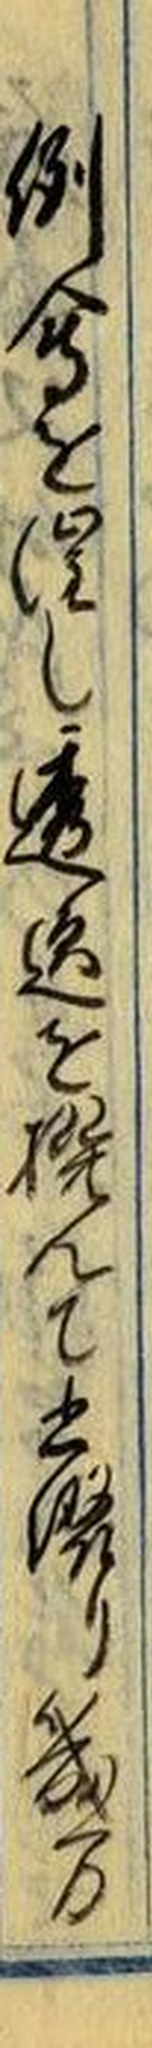例会を催し透逸を撰んて書綴り幾万
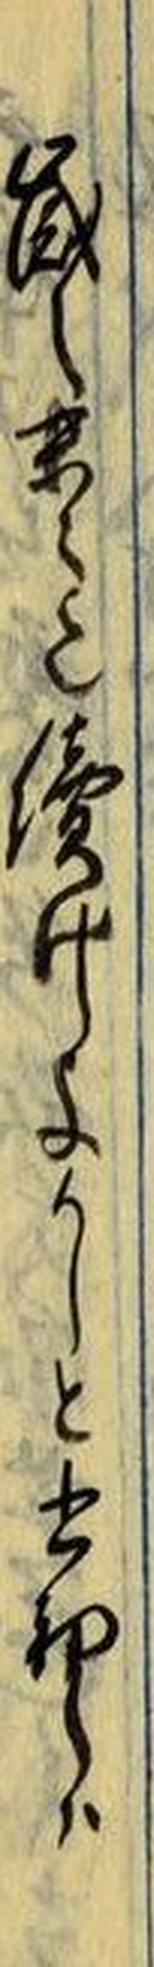歳之末々迄続けよかしと書初しは
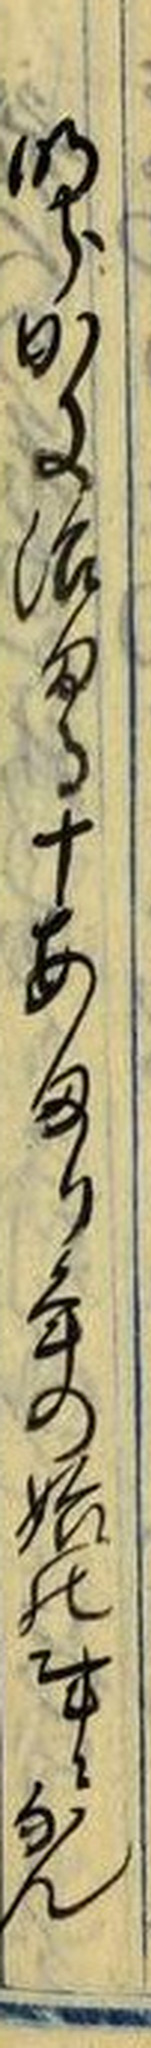明らかに治まる十あまり年の始の事になん
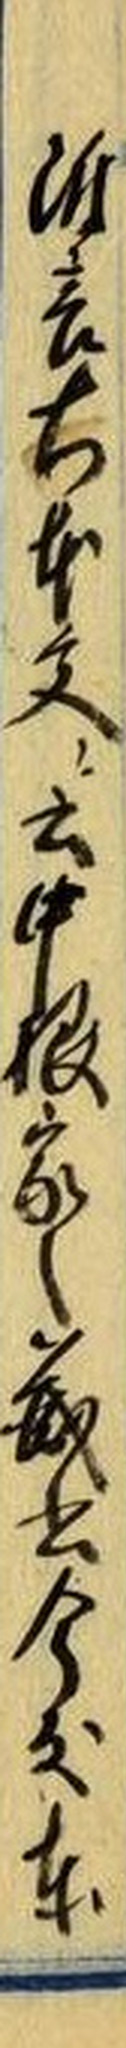附表右本文に云中根家之蔵書今度東
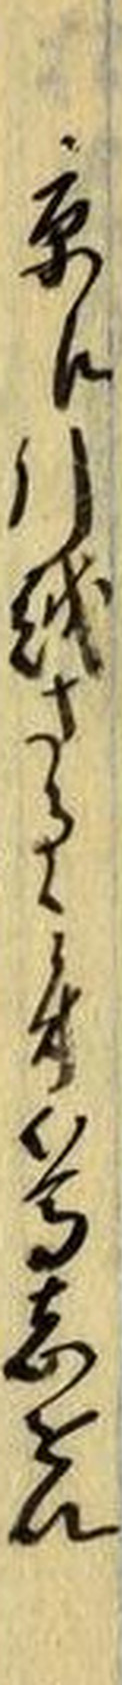京え引越さるゝに付尊志を以
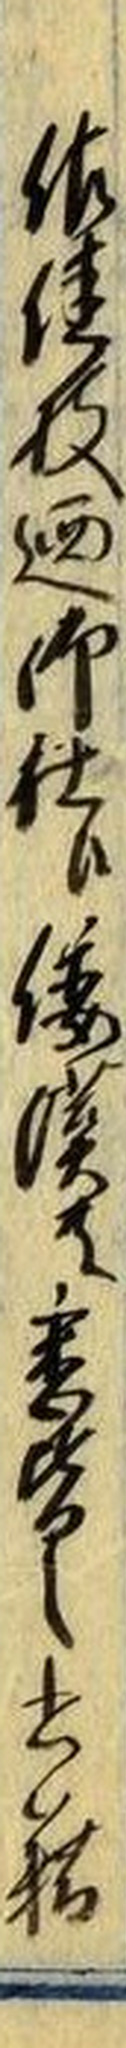佐佳枝廼御社え倭漢共悉皆之書籍
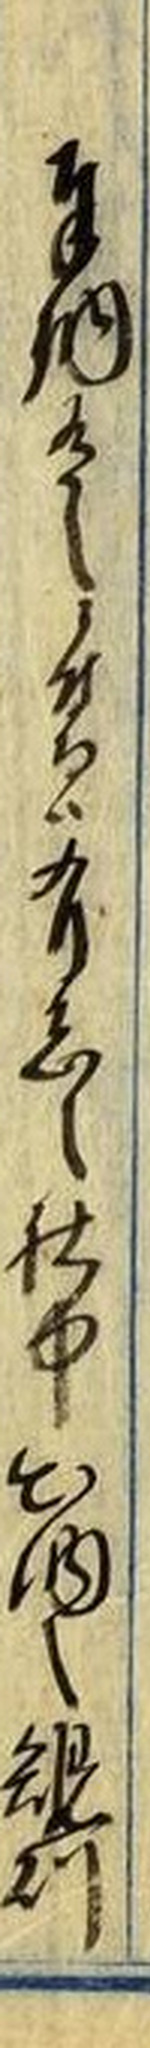奉納有之に付而は有志之社中出納之規則
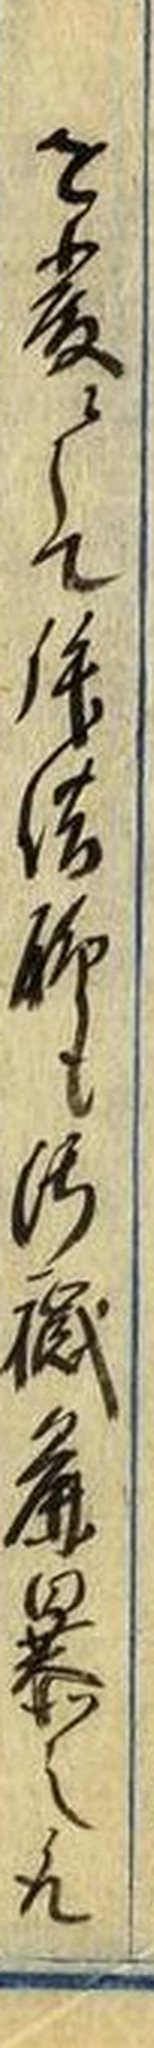を厳にして拝借聊も汚穢麁暴之取
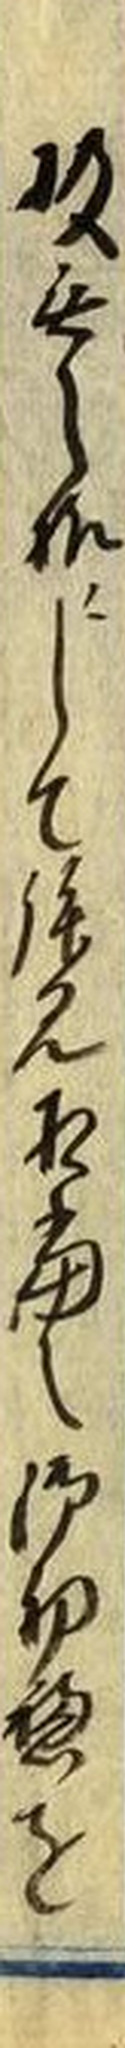扱無之様にして拝見相当之御初穂を
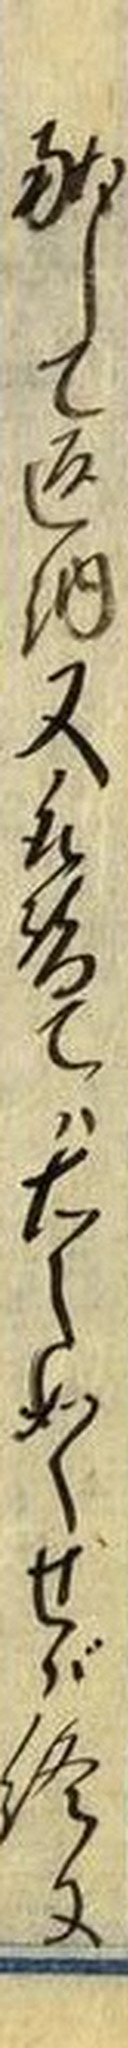献して返納又取替ては右之如くせば終又
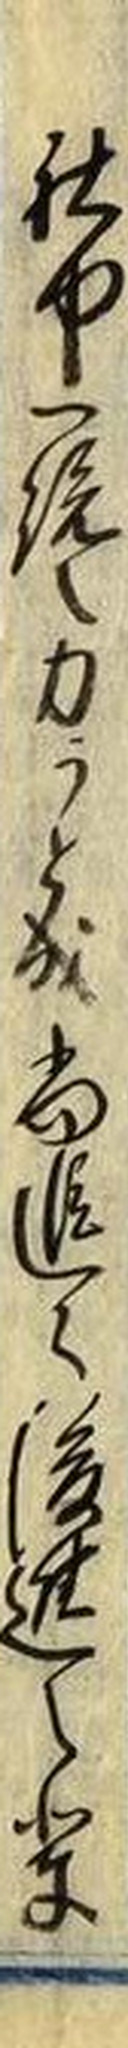社中一統之力らと成尚追々後進之輩
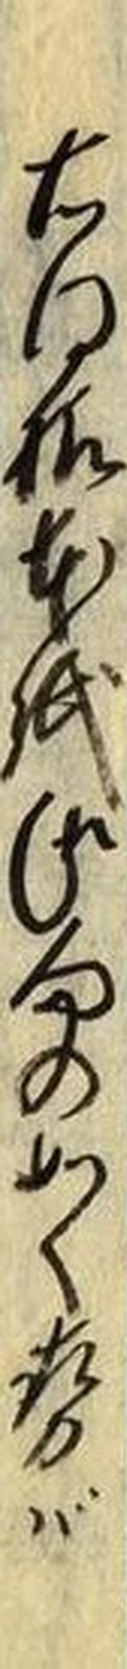右同様本紙趣向の如くせば
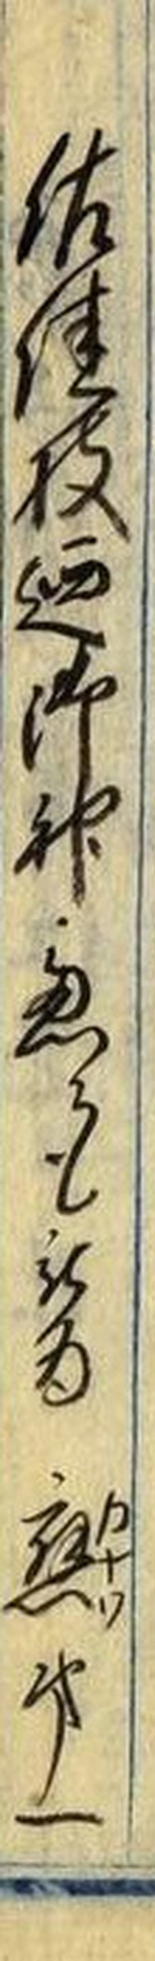佐佳枝廼御神慮にも被為応第一

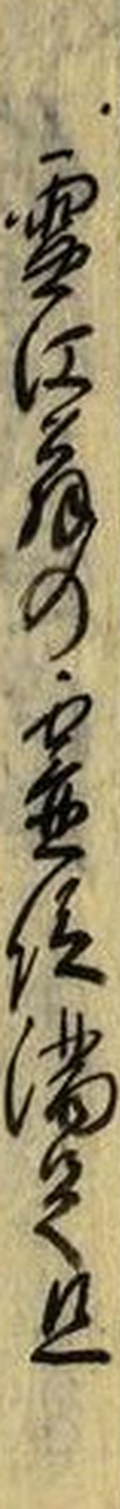雪江翁の霊位満足且
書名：温古集 三巻
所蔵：福井県文書館 Fukui Prefectural Archives
